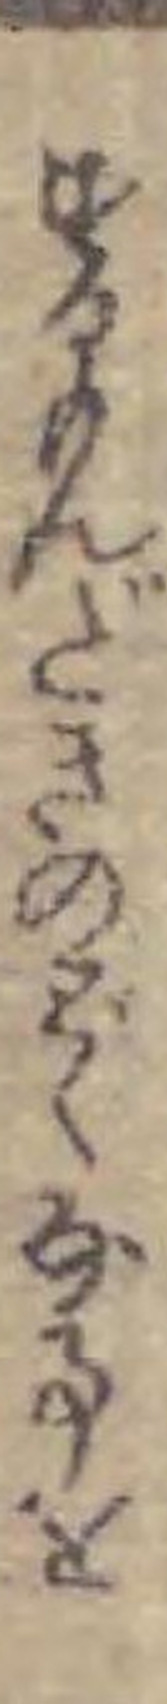するもんだきのどくな事を
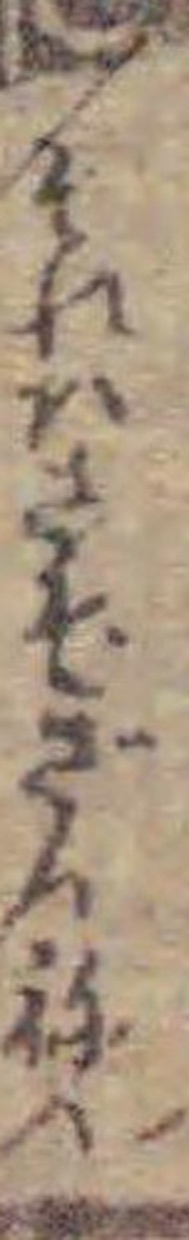それはさぞざねん
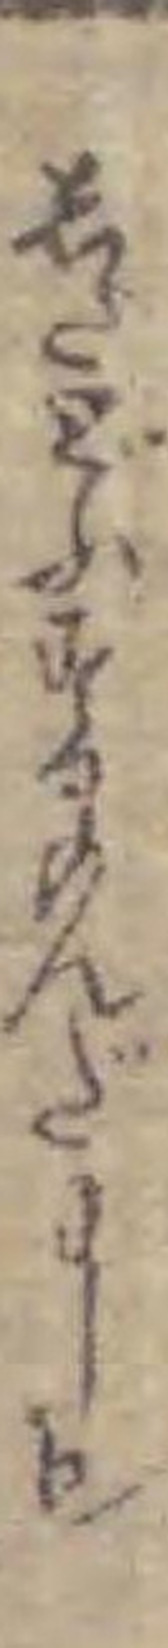したどふするもんだわしも
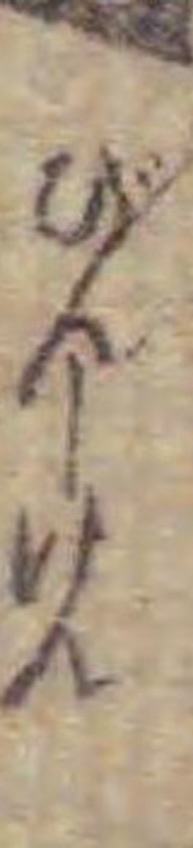びんしけん
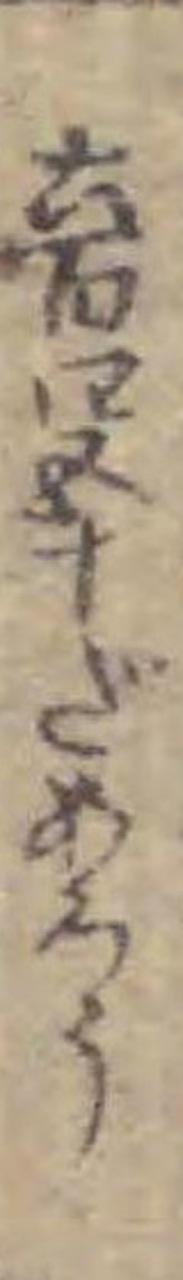六日四五十だあろう
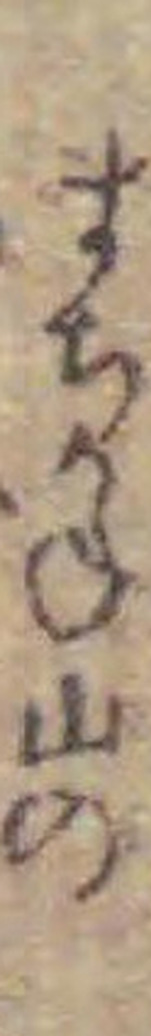まちかね山の
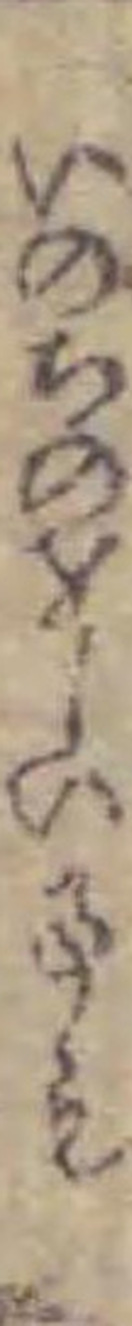いのちのをしい事も
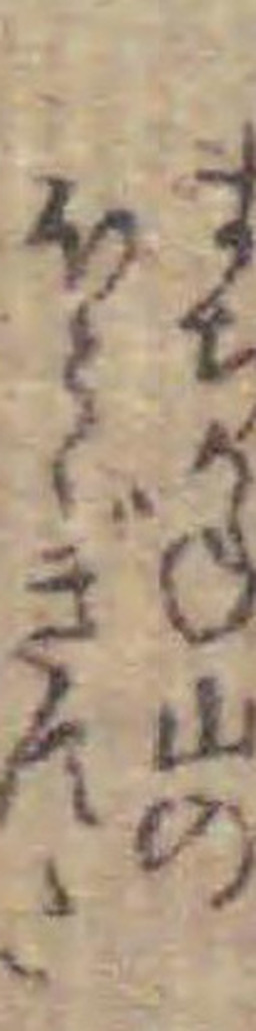ほとゝぎすた
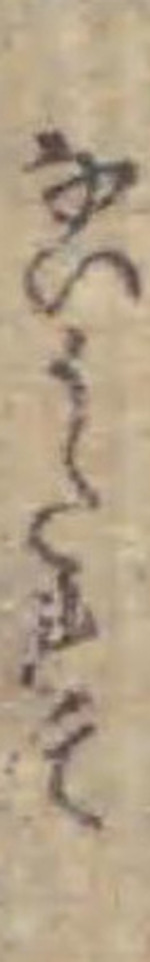ないうたれて
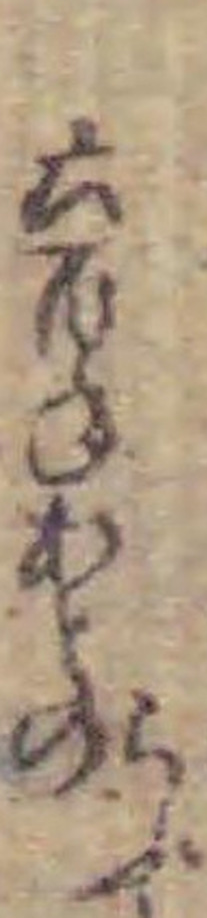六百年あとの
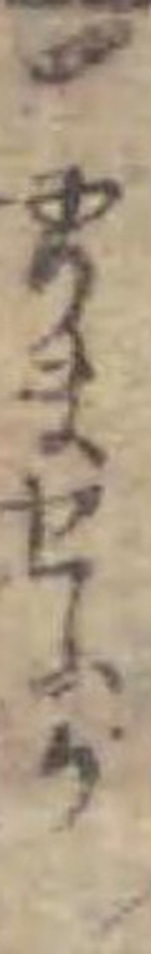やりませふが
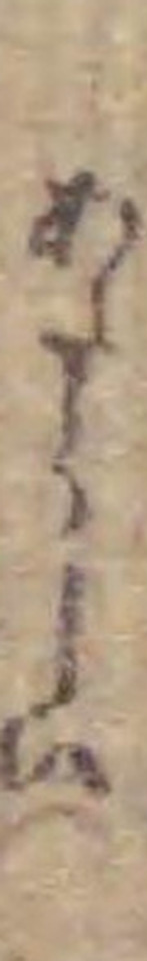あたらしい
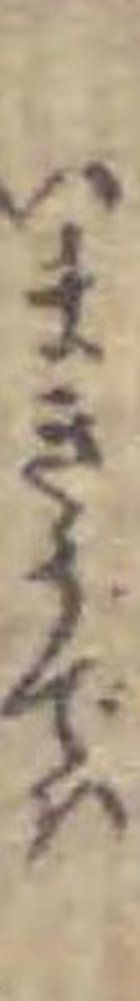いまきうでは
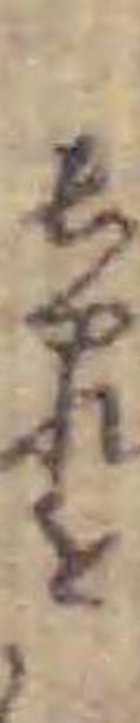しやれを
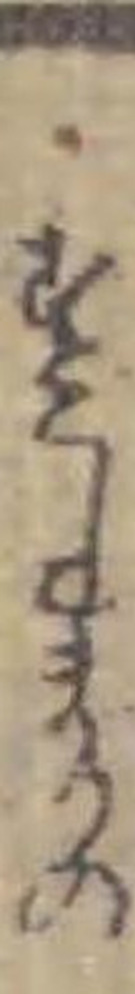すこしこまりの
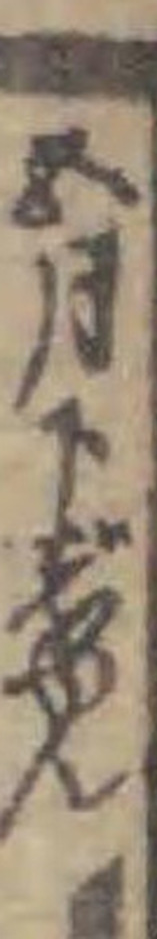五月下じゆん
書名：年寄之冷水曽我 : 3巻
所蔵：国立国会図書館 National Diet Library, JAPAN
